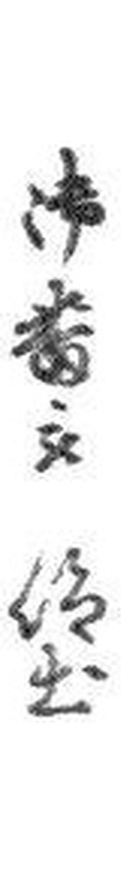御番被仰出
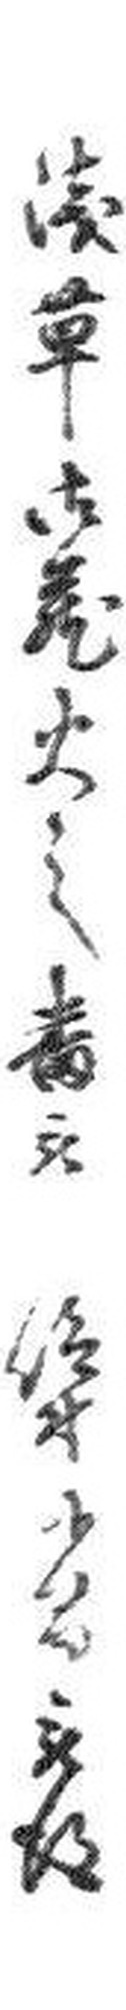浅草御蔵火之番被仰付候間被得
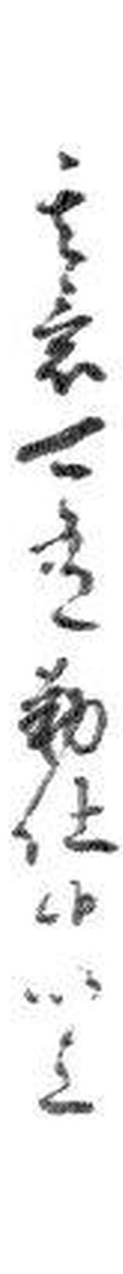其意可有勤仕候以上
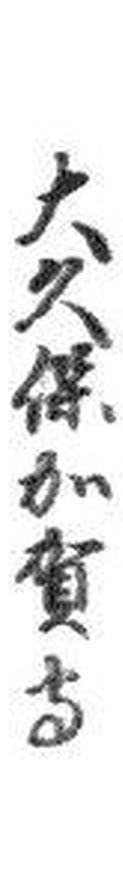大久保加賀守
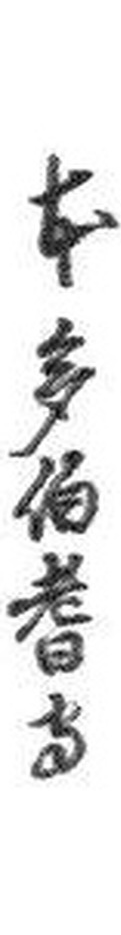本多伯耆守

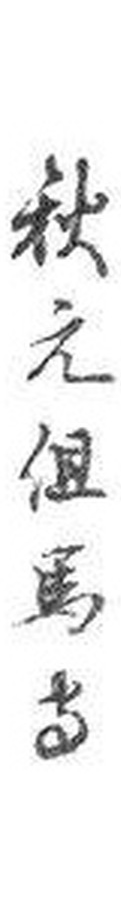秋元但馬守
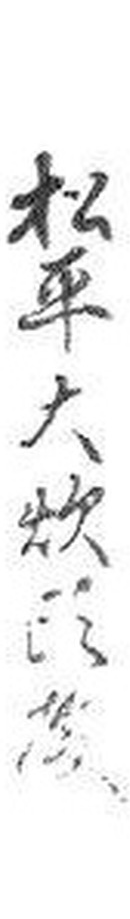松平大炊頭殿
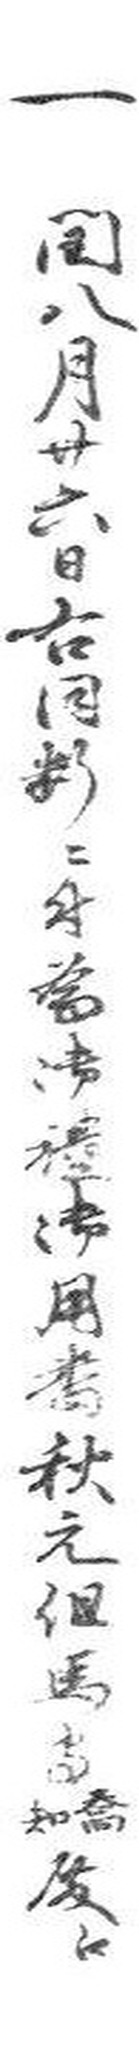一八月廿六日右同断ニ付為御礼御用番秋元但馬守喬知殿江
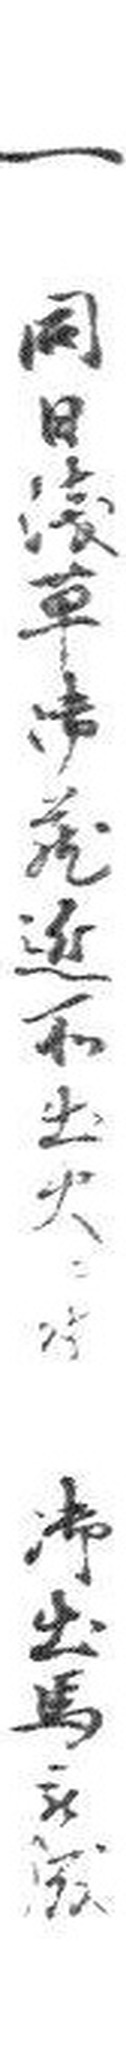一同日浅草御蔵近所出火ニ付御出馬被成
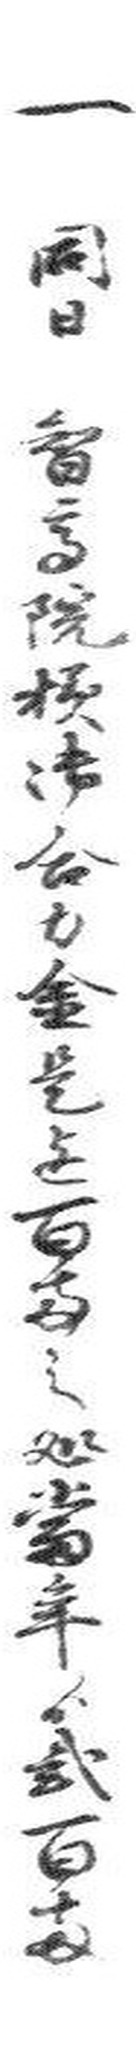一同日智高院様御合力金是迄百両之処当年ゟ二百両
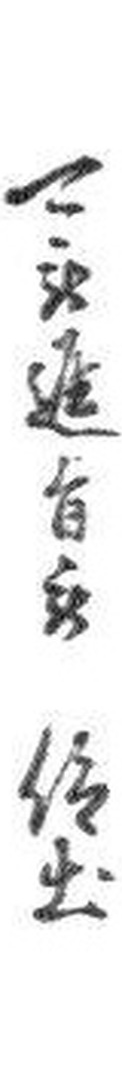可被進旨被仰出
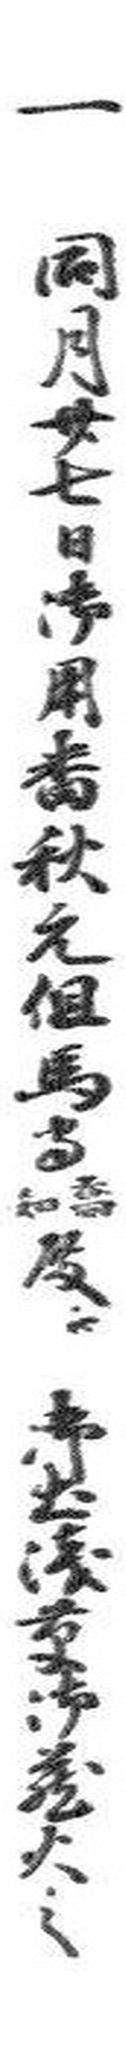一同月廿七日御用番秋元但馬守喬知殿江御出浅草御蔵火之
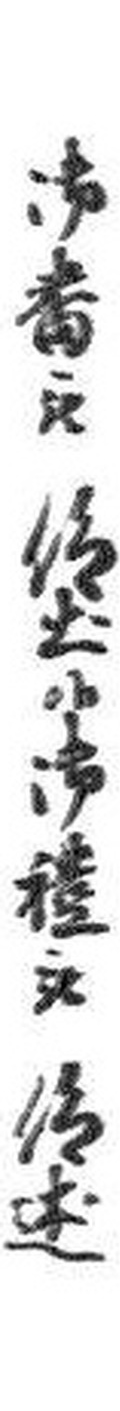御番被仰出候御礼被仰述
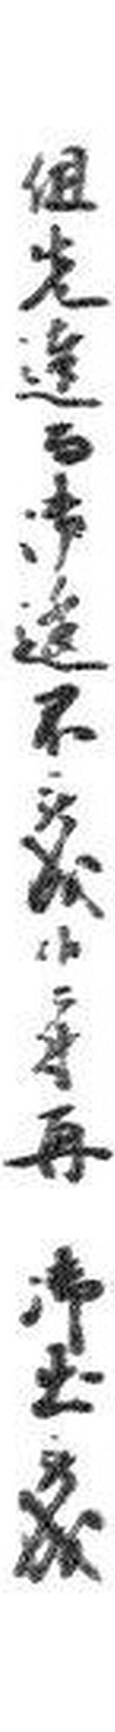但先達而御逢不被成候ニ付再御出被成
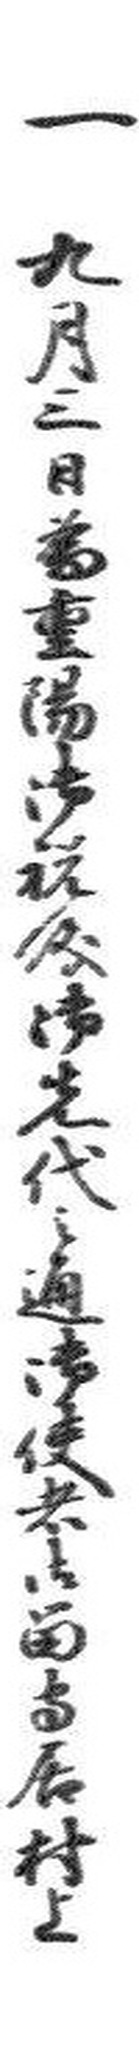一九月三日為重陽御祝儀御先代之通御使者御留守居村上
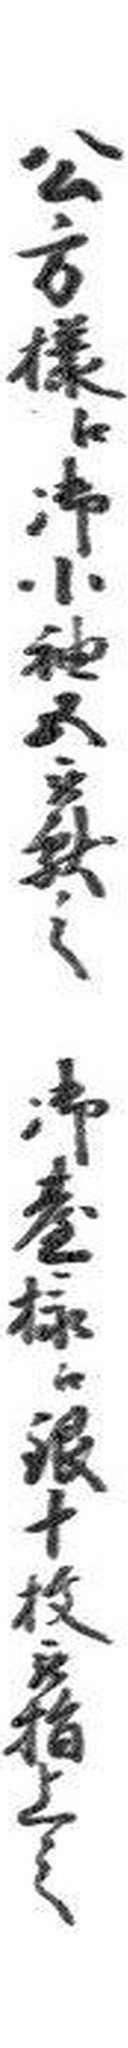公方様江御小袖五被献之御台様江銀十枚被指上之
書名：家譜 二十八 吉邦公 従宝永七年七月五日到正徳元年十二月
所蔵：福井県文書館 Fukui Prefectural Archives
